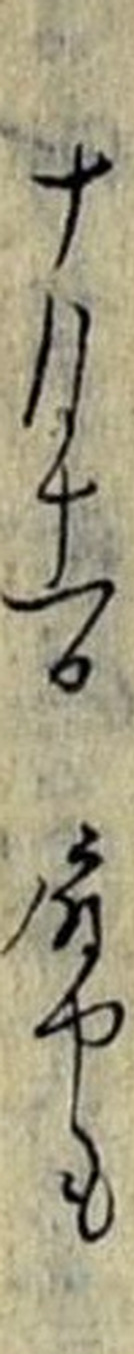十月十一日府中へも
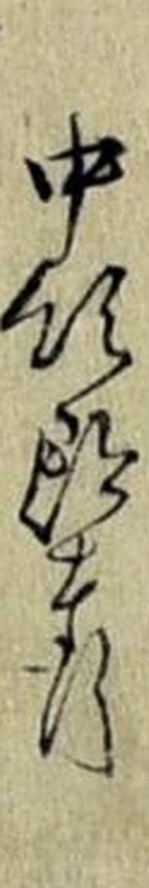中領郡奉行
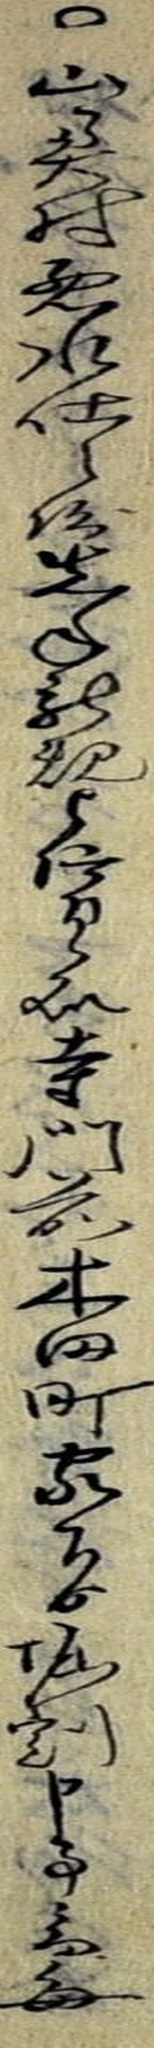〇山奥村悪水仕之儀先年新規被仰付候処寺門前木田町家下ゟ掘割申事ニ而毎
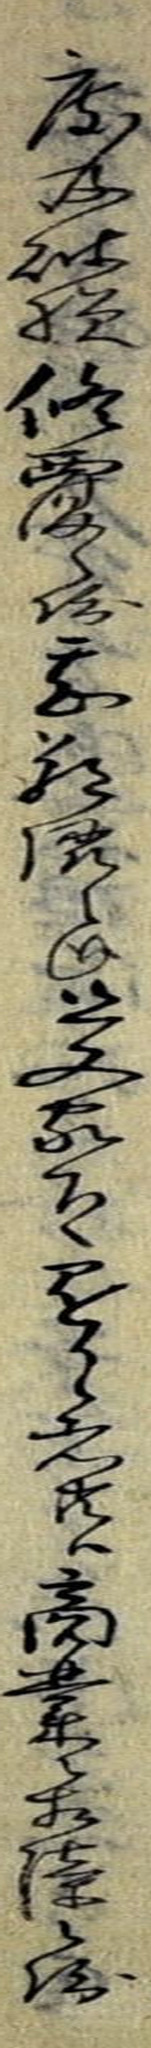度及破損修覆之儀甚難渋之趣且又家下へ懸り候者共ハ商業ニ相障候儀
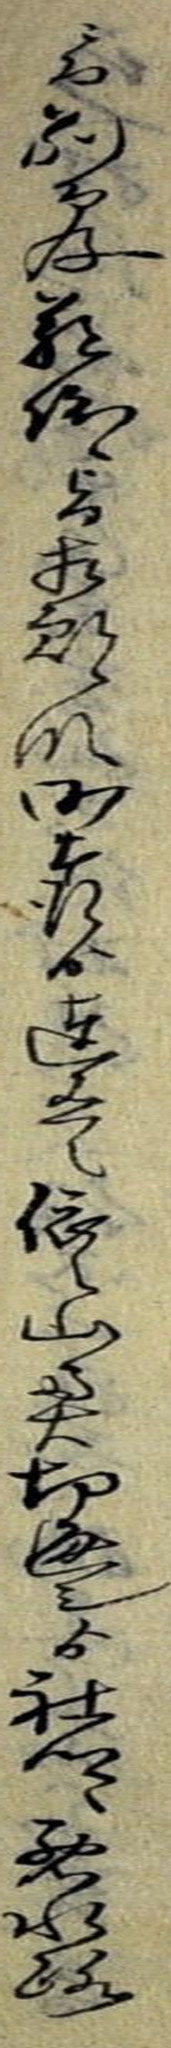ニ而別而及難儀候旨相願候段町奉行ゟ達有之依之山奥切通シゟ社郷へ悪水路
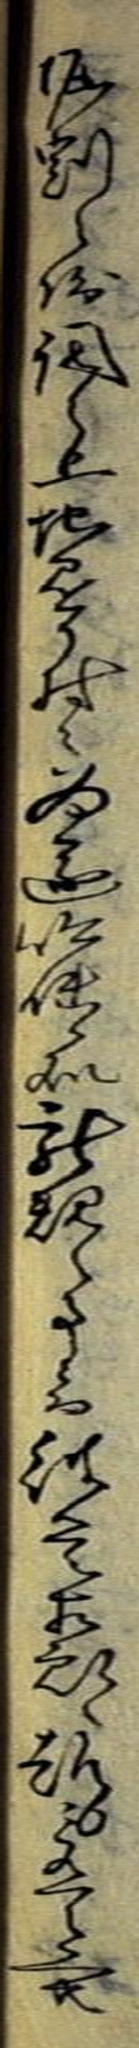掘割之儀伺之上地懸り村々為遂吟味候処新規之事ニ而彼是相願候趣も有之候へ共
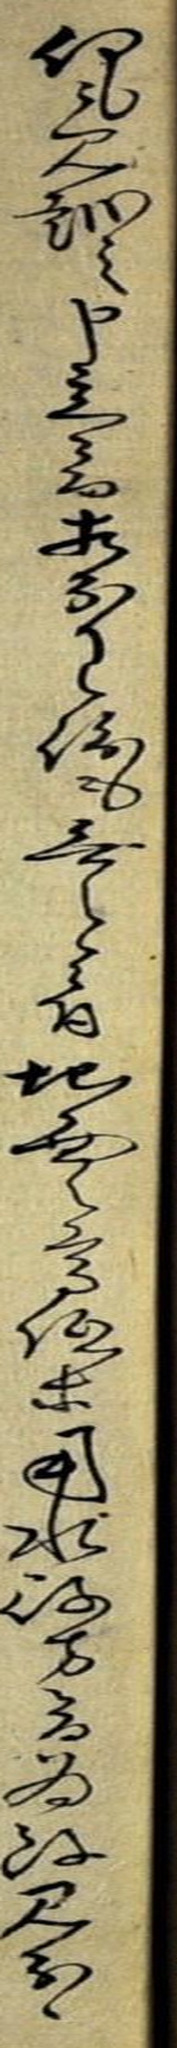何も見越之申立ニ而相分り候儀も無之候ニ付地面之高低等用水役方ニ而為致見分候
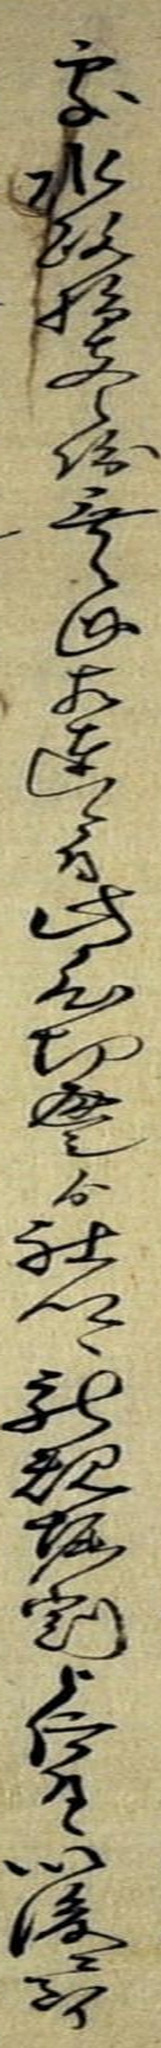処水路指支之儀無之趣相達候ニ付此度切通シゟ社郷へ新規掘割被仰付候以後ニ至り
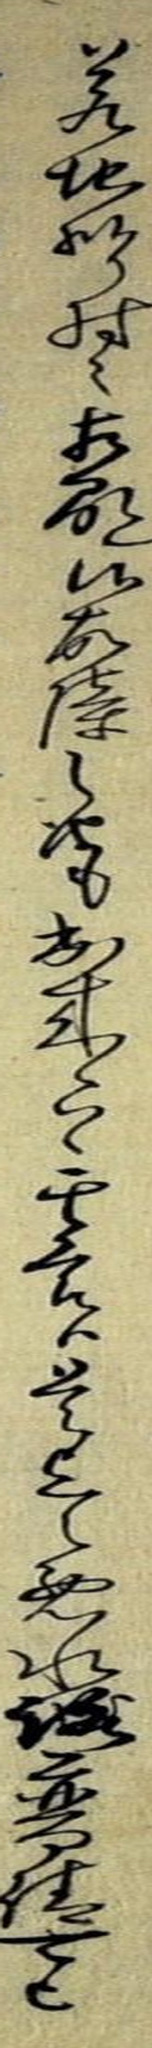若地掛り村々相顕レ候故障之儀も出来候ハヽ其節ハ是迄之悪水路普請可被
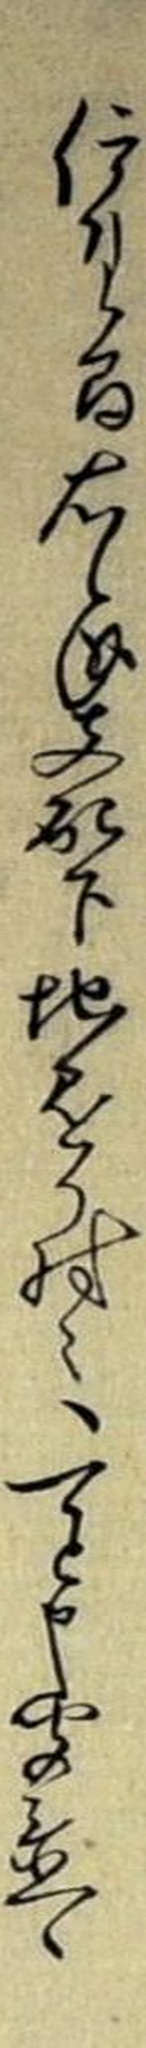仰付候間右之趣支配下地懸り村々へ可被申聞置候
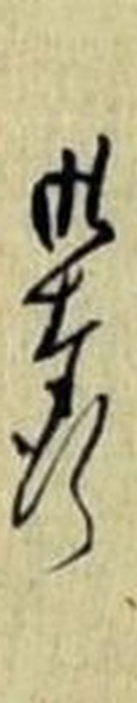御奉行
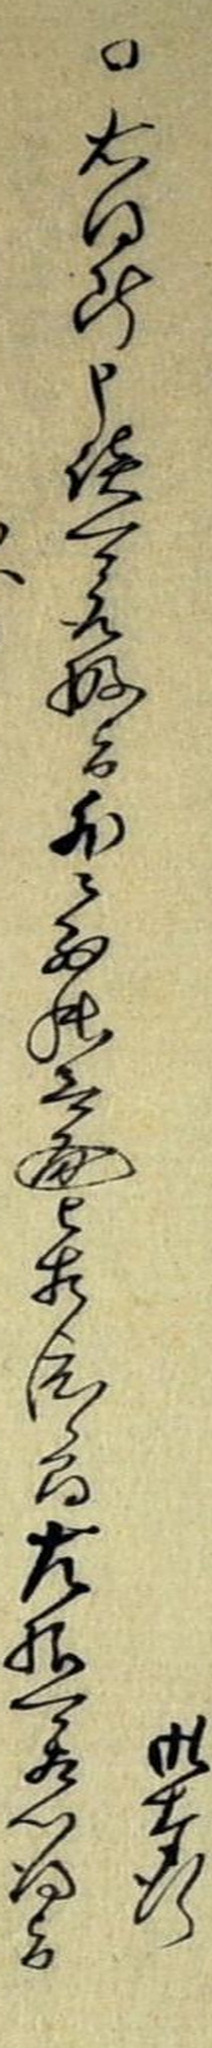〇右同断申談可取扱旨外ニ別紙壱通被相渡候間左様可相心得旨
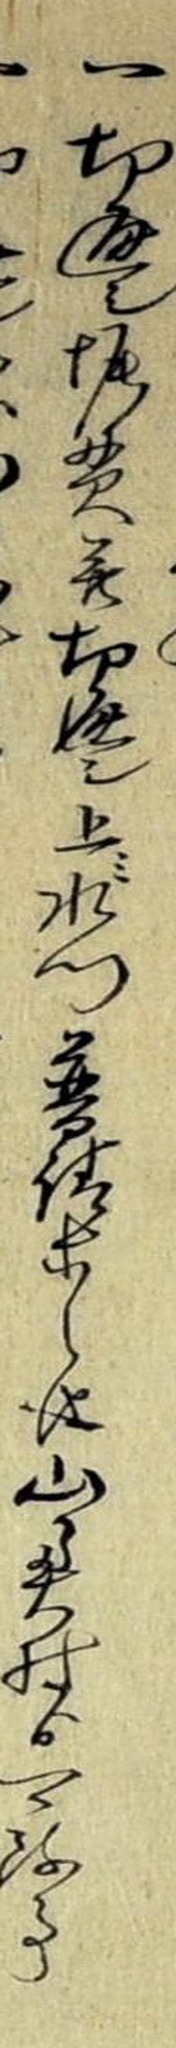一切通シ堀貫并切通シ上ミ水門普請等之儀山奥村ゟ可致事
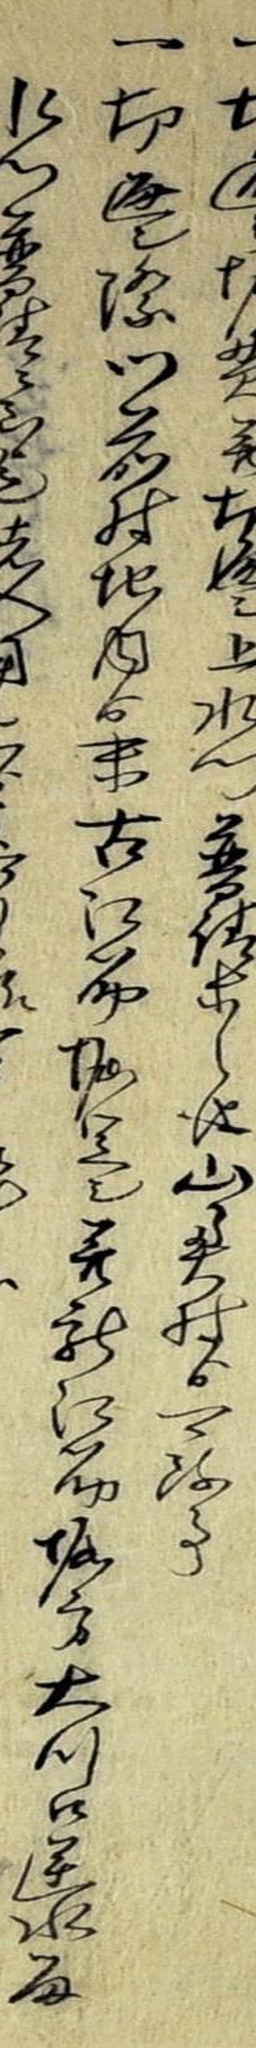一切通シ際門前村地内ゟ末古江筋堀足シ并新江筋掘方大川口逆水留
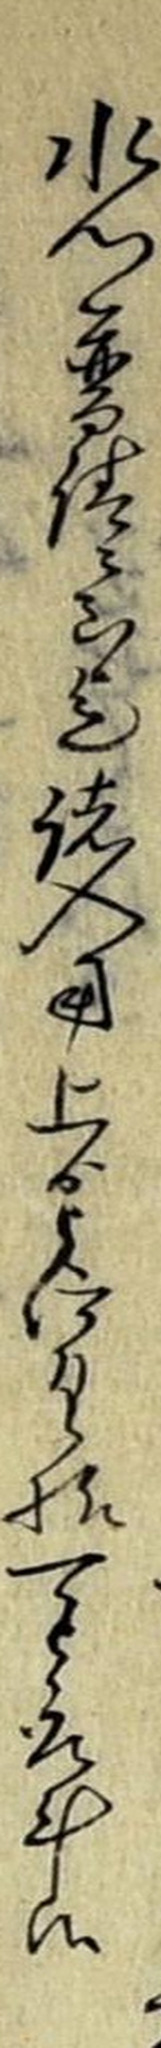水門普請ニ至迄諸入用上ゟ被仰付候様可被取計候
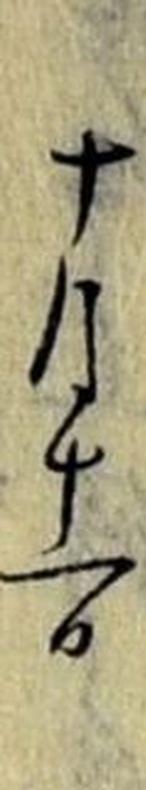十月十一日
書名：命令之部 三
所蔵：福井県文書館 Fukui Prefectural Archives
